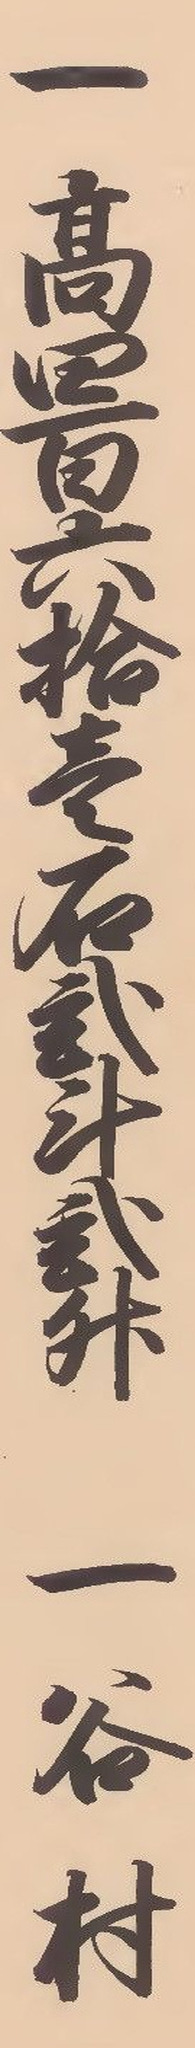一高四百六拾壱石弐斗弐升一谷村
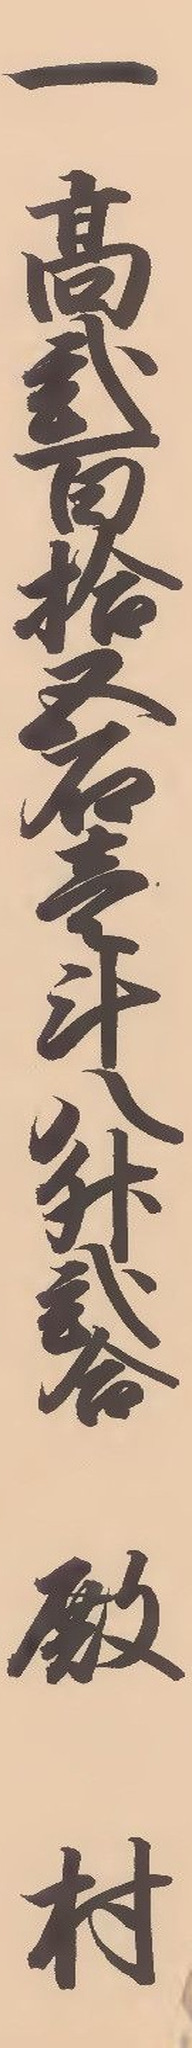一高弐百拾五石壱斗八升弐合殿村
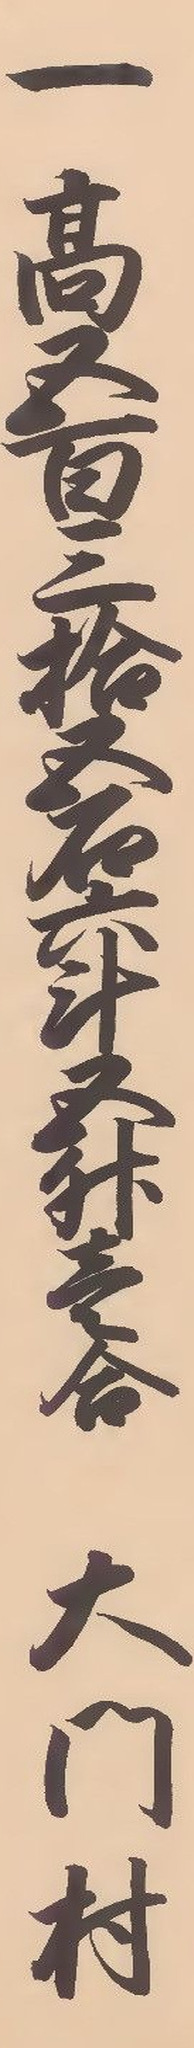一高五百三拾五石六斗五升壱合大門村

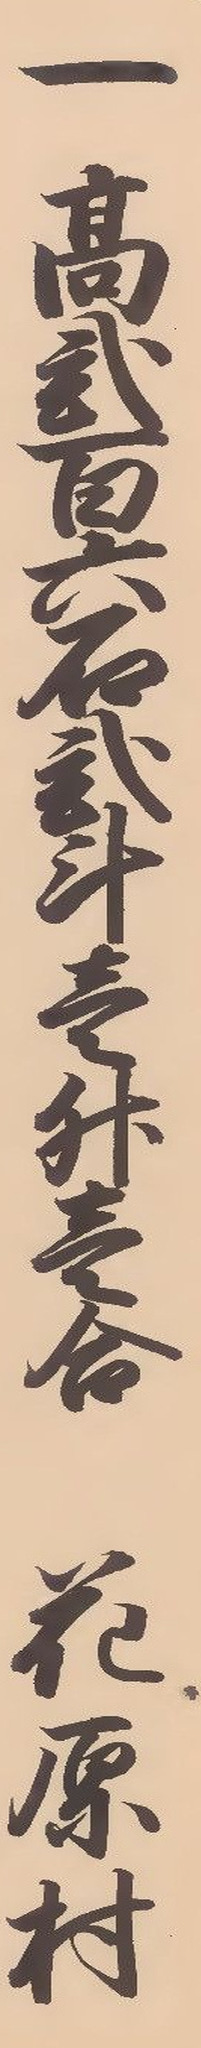一高弐百六石弐斗壱升壱合花原村
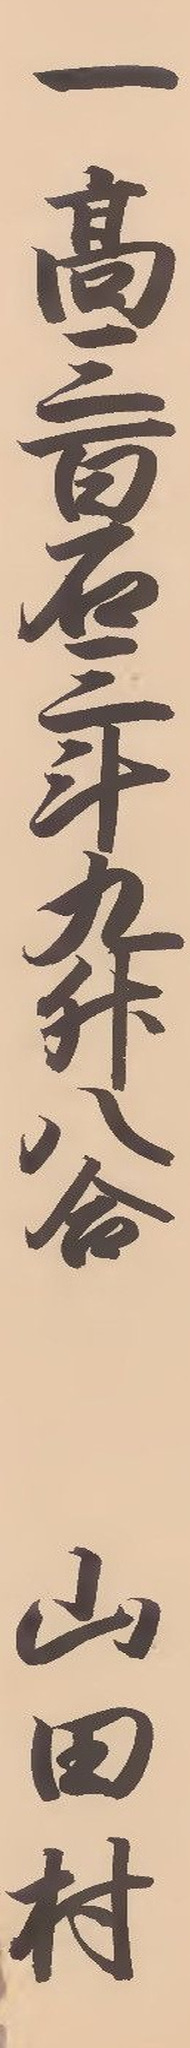一高三百石三斗九升八合山田村
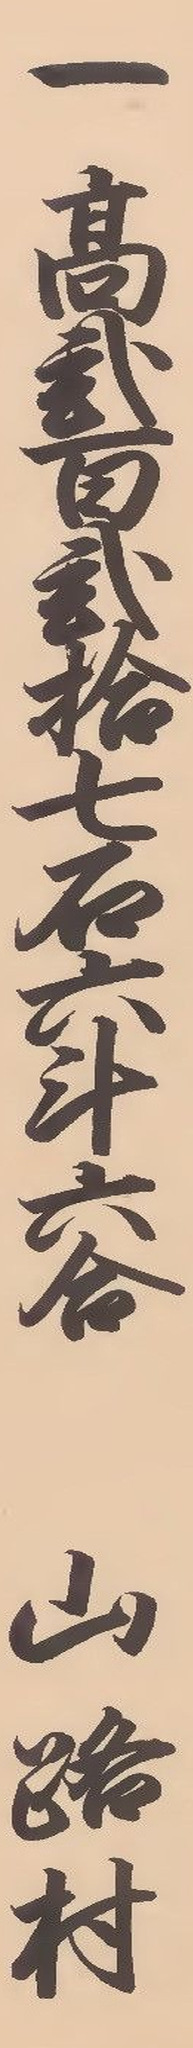一高弐百弐拾七石六斗六合山路村
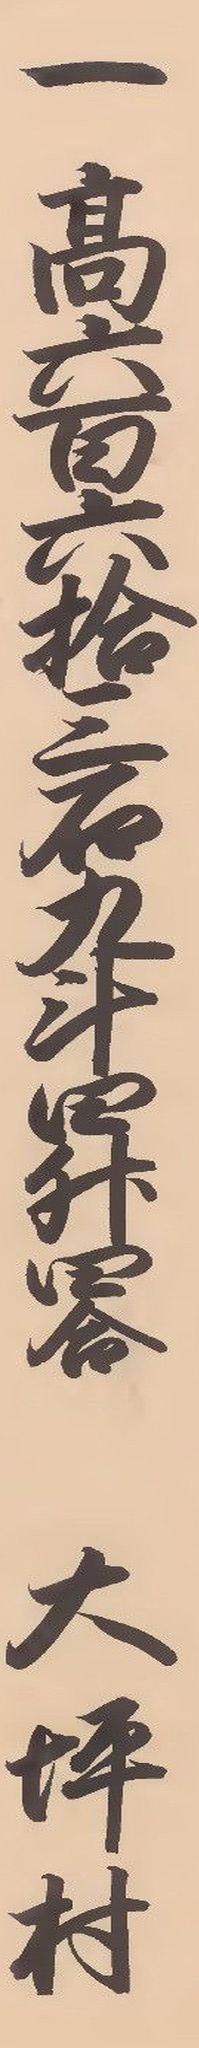一高六百六拾三石九斗四升四合大坪村
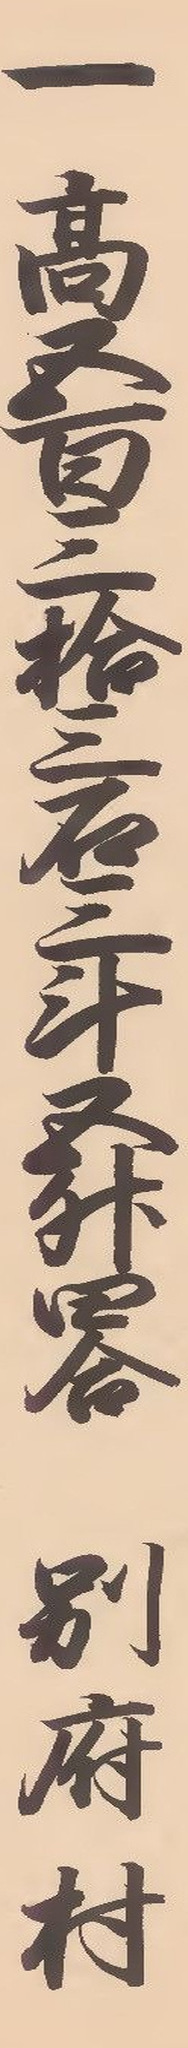一高五百三拾三石三斗五升四合別府村
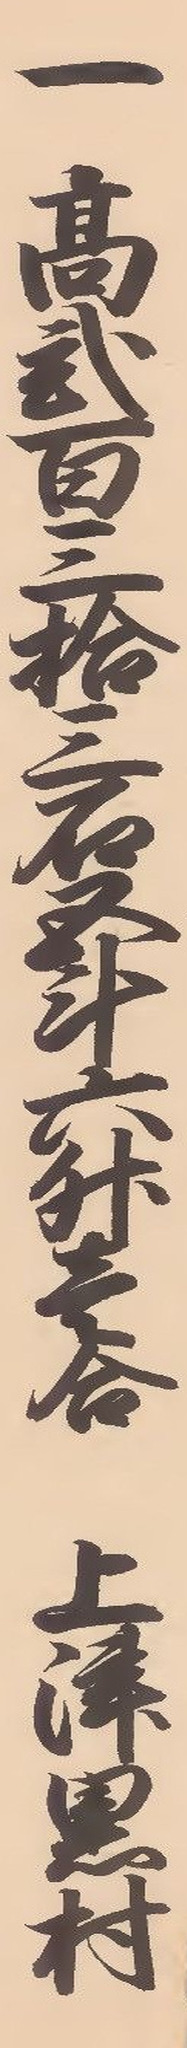一高弐百三拾三石五斗六升壱合上津黒村
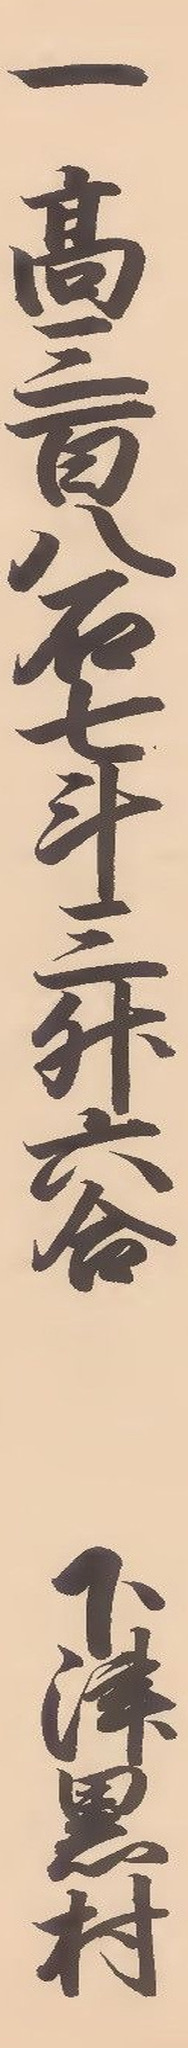一高三百八石七斗三升六合下津黒村

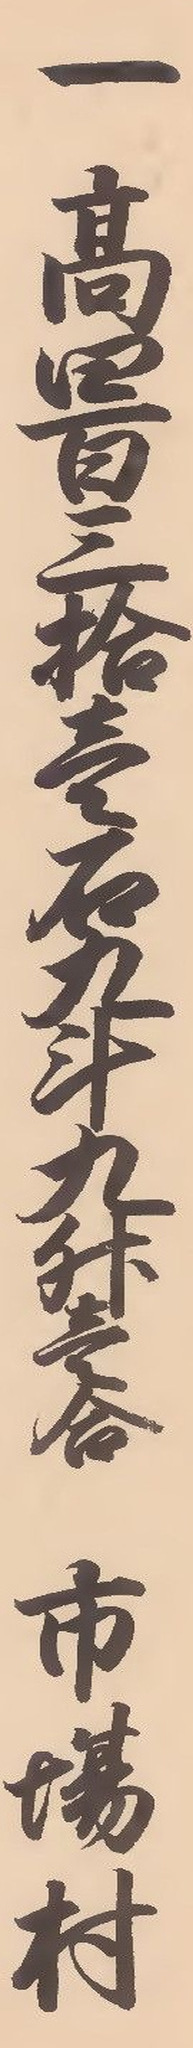一高四百三拾壱石九斗九升壱合市場村
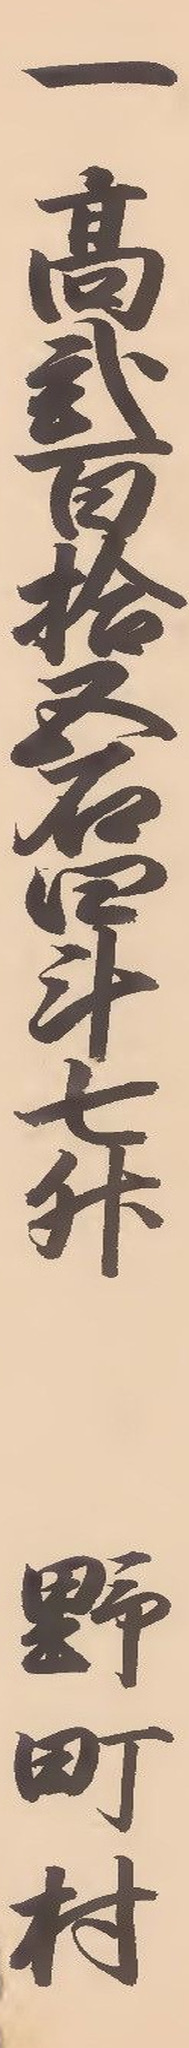一高弐百拾五石四斗七升野町村
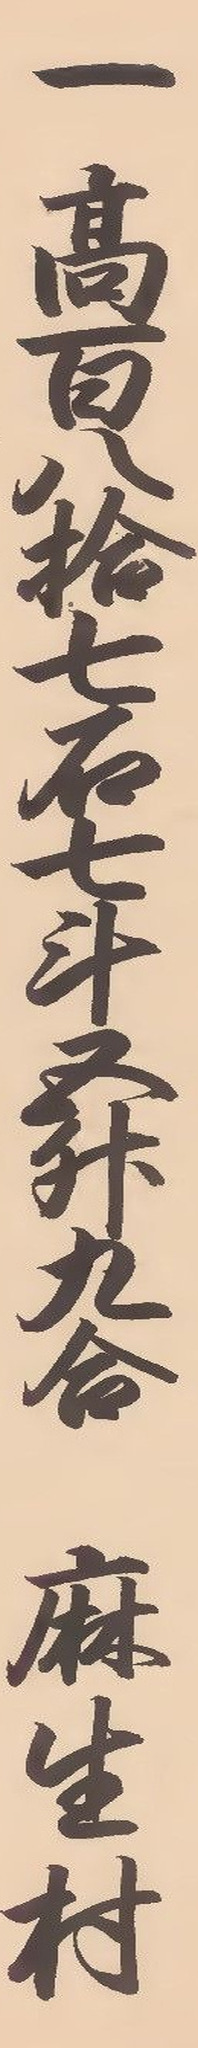一高百八拾七石七斗五升九合麻生村
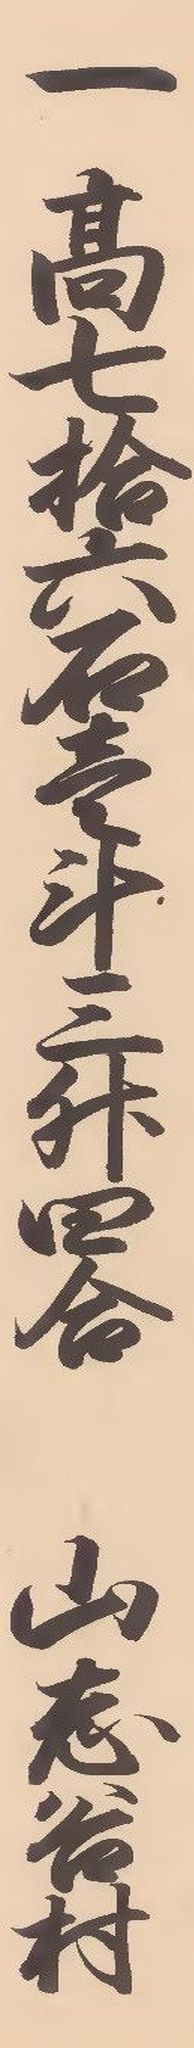一高七拾六石壱斗三升四合山志谷村
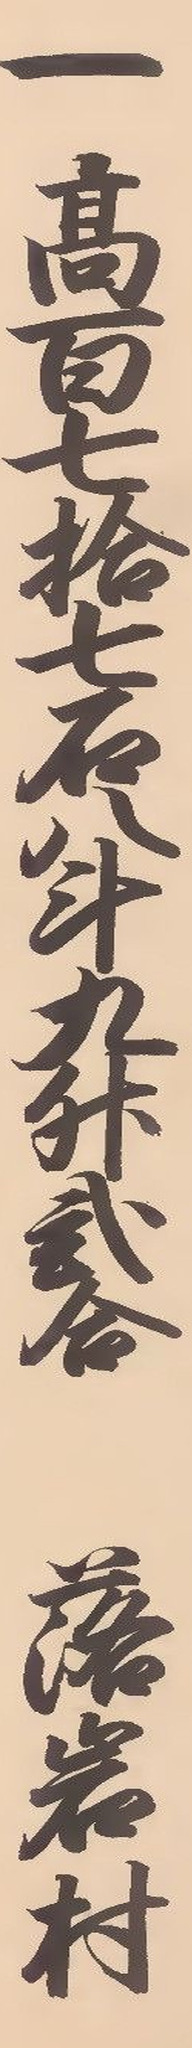一高百七拾七石八斗九升弐合落岩村
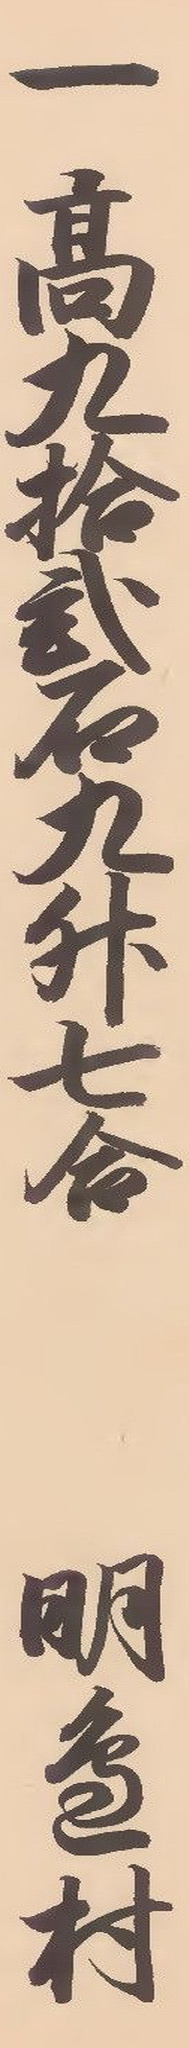一高九拾弐石九升七合明辺村
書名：因幡国郷帳
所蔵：国立公文書館 National Archives of Japan
